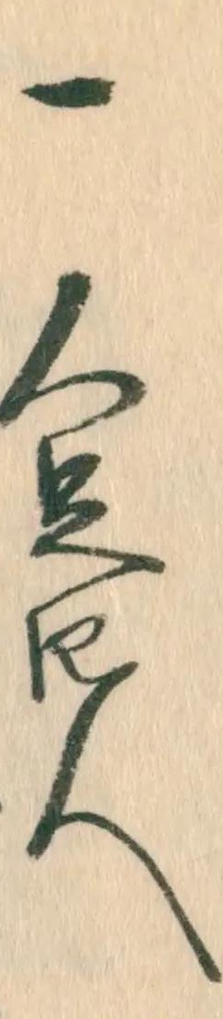一人足四人

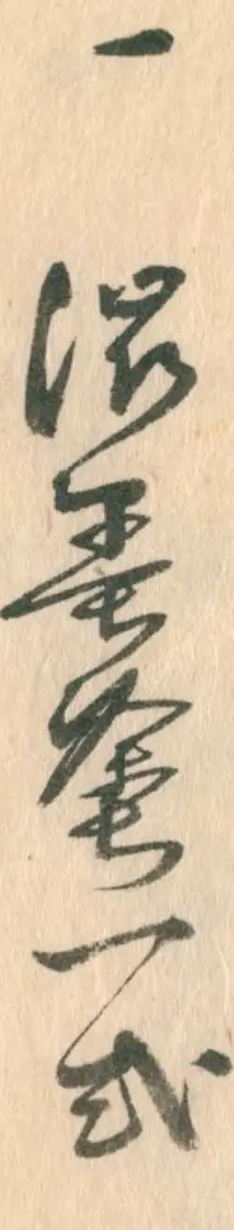一渋墨塗一式
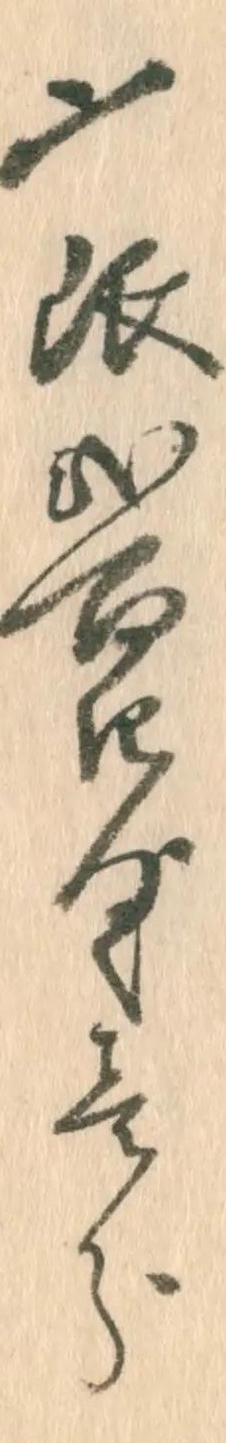〆銀弐百四匁壱分
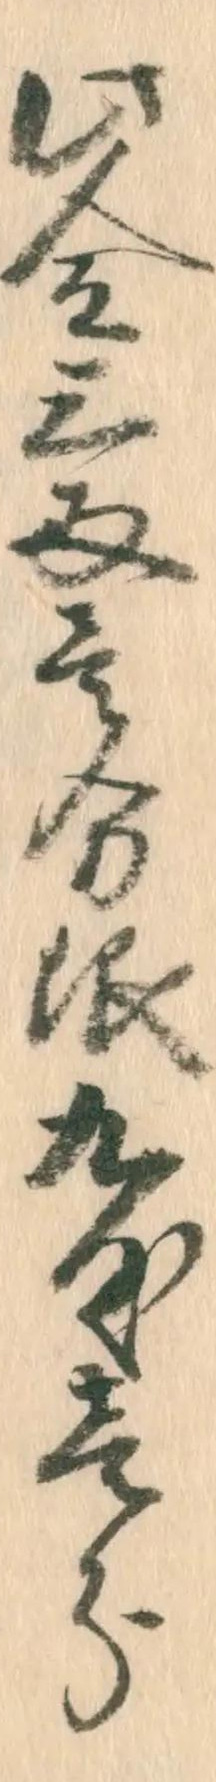此金三両壱分銀九匁壱分
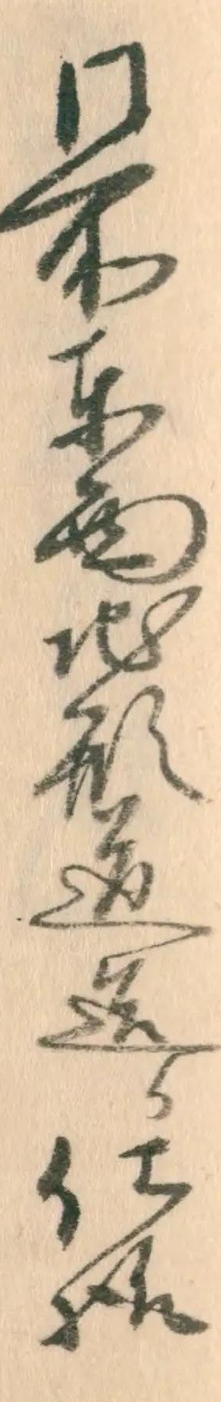同所東西地形道造り仕様
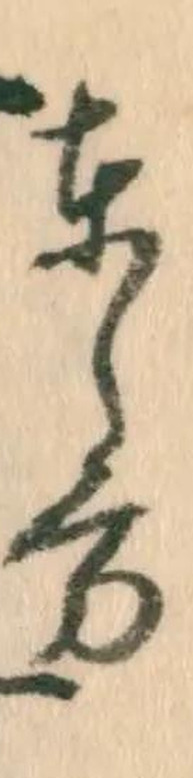東之方
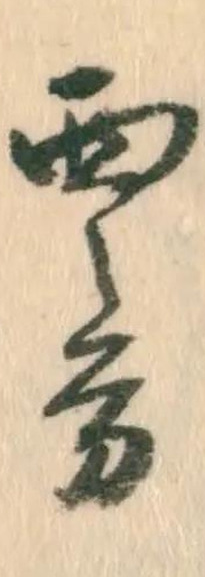西之方
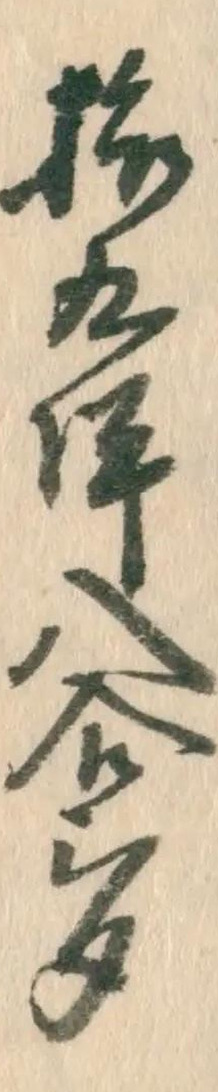拾九坪八合三勺三間

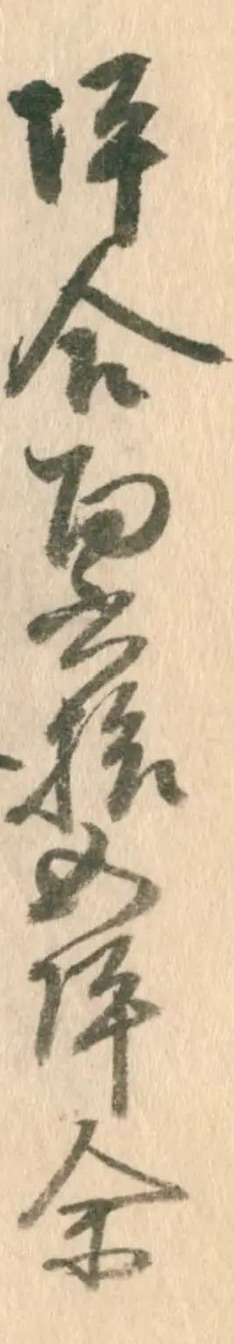坪合百六拾五坪余
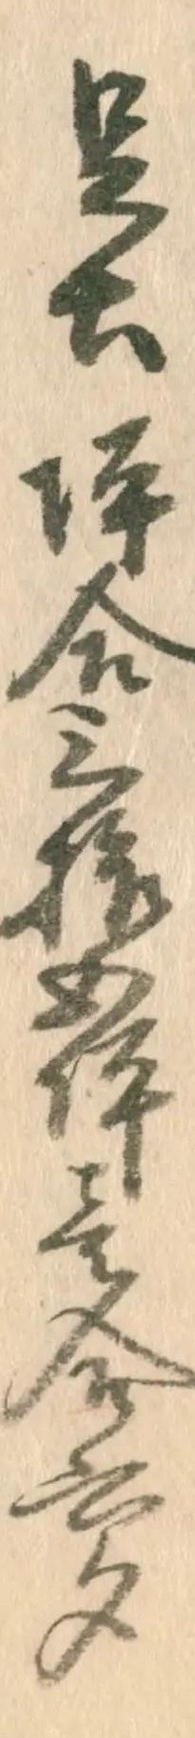足土坪合三拾五坪壱合六勺
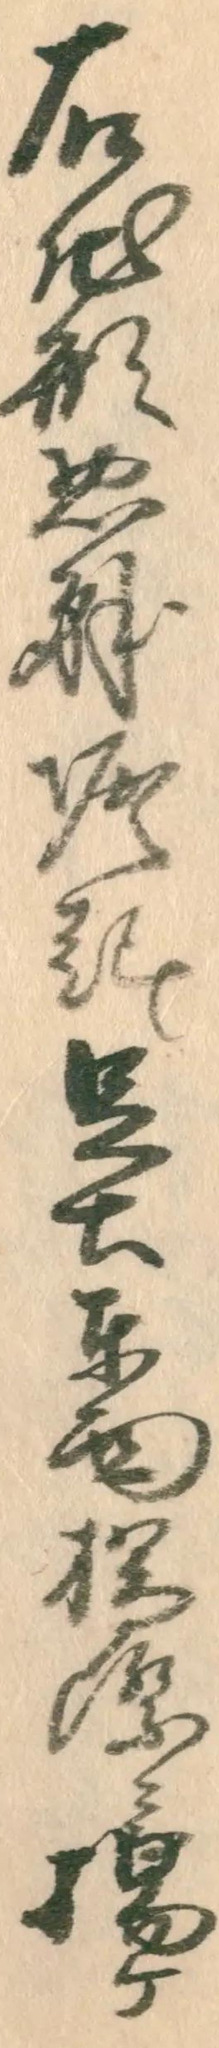右地形惣体堀起し足土東西橋際ニ揚ケ
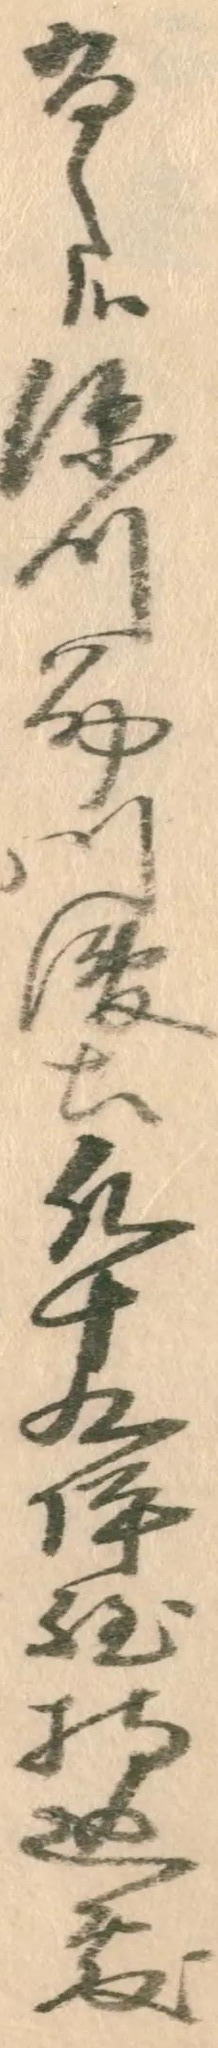有之候深川筋川浚土凡十九坪程持込敷
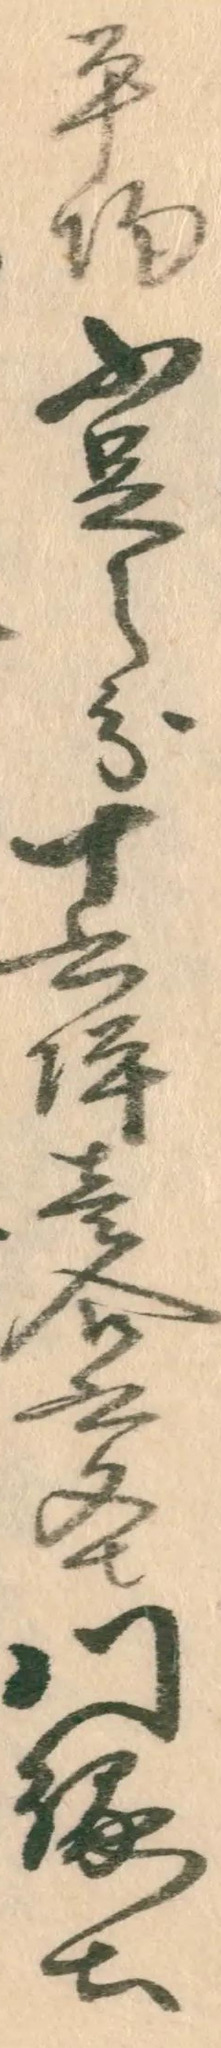平均不足之分十六坪壱合六勺は川縁土
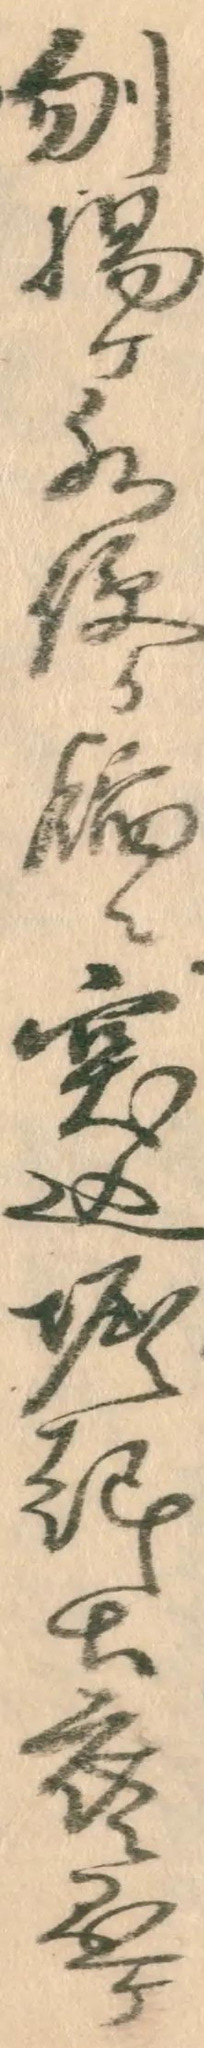刎揚ケ水絞り餡ニ突込掘起し土衣ニ懸ケ
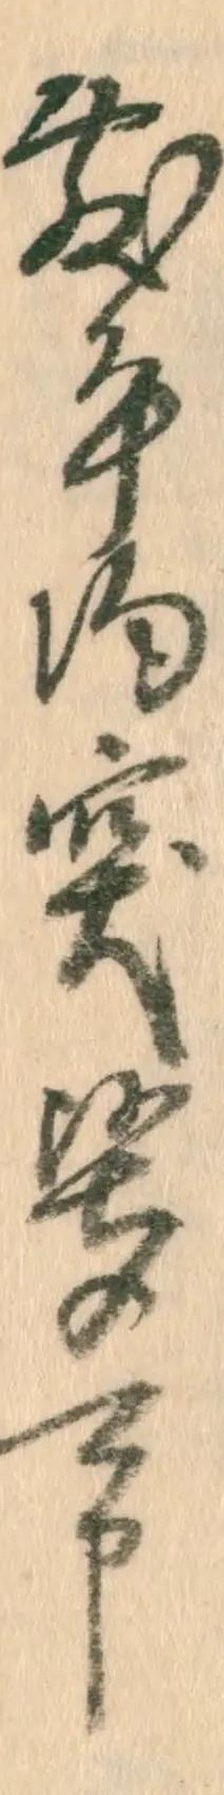敷平均突堅メ可申
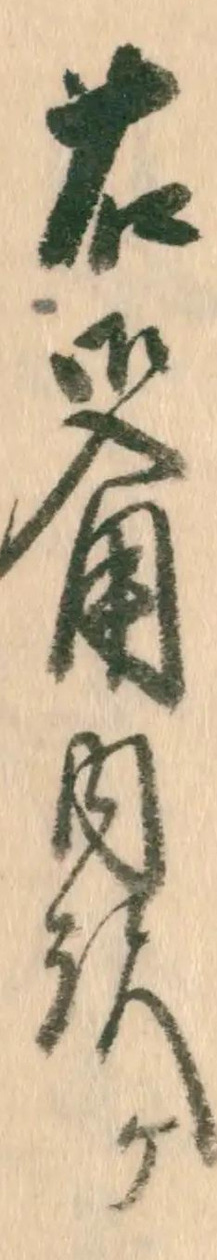右御入用内訳ケ
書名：三橋 17巻. [7] 三橋小破御修復書留　但御奉行御掛リ替地震潰橋番屋　嘉永四亥年より安政二卯年迄　上
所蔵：国立国会図書館 National Diet Library, JAPAN
